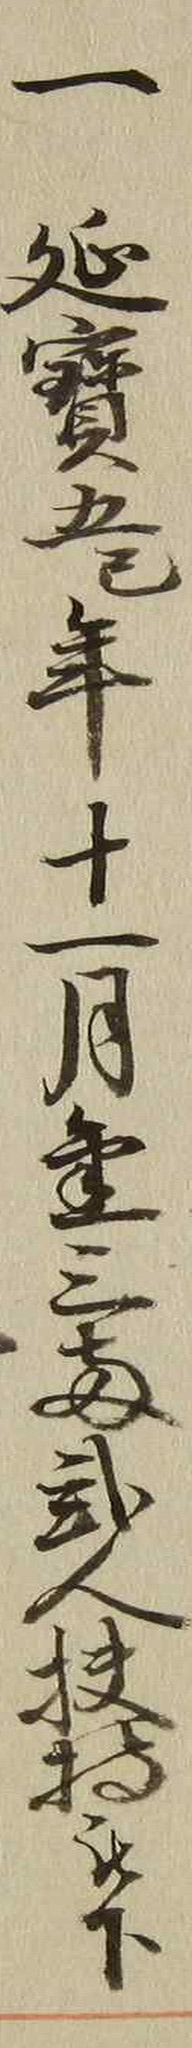一延宝五巳年十一月金三両弐人扶持被下
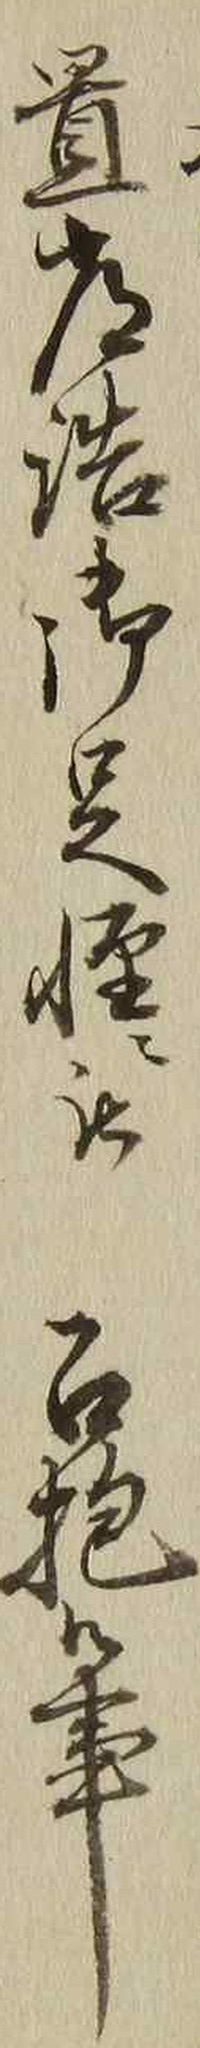置道詰御足軽ニ被召抱候事
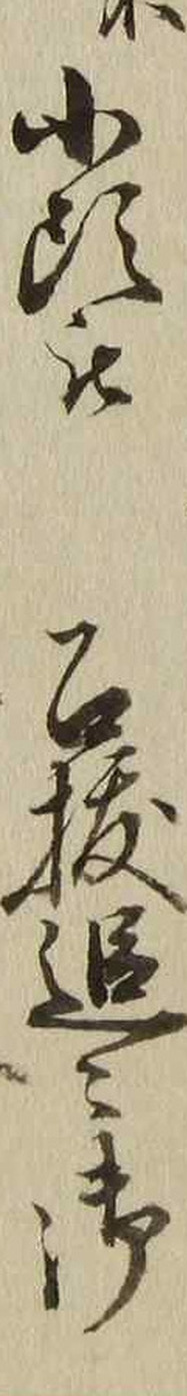小頭被召抜候事
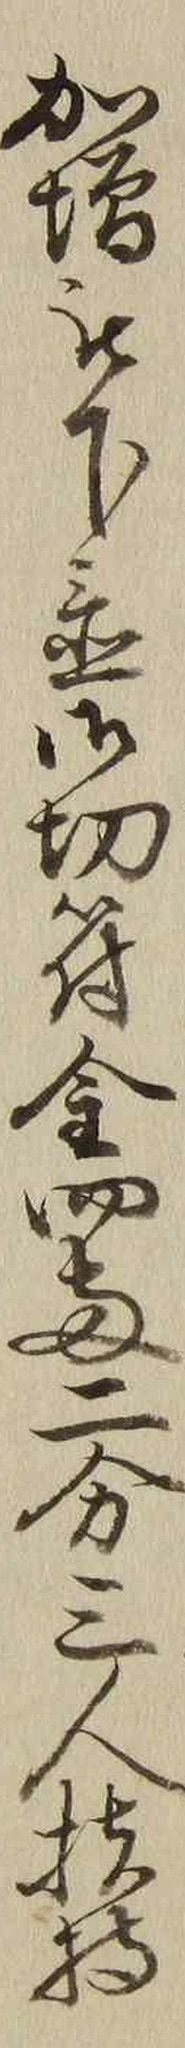加増被下置御切符金四両ニ分三人扶持
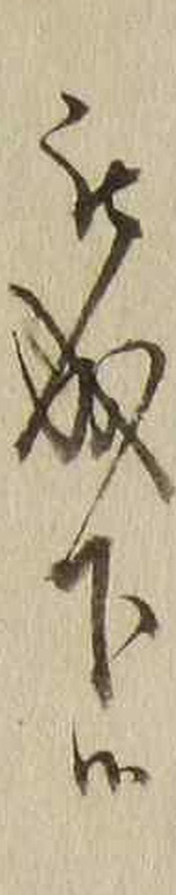被成下候
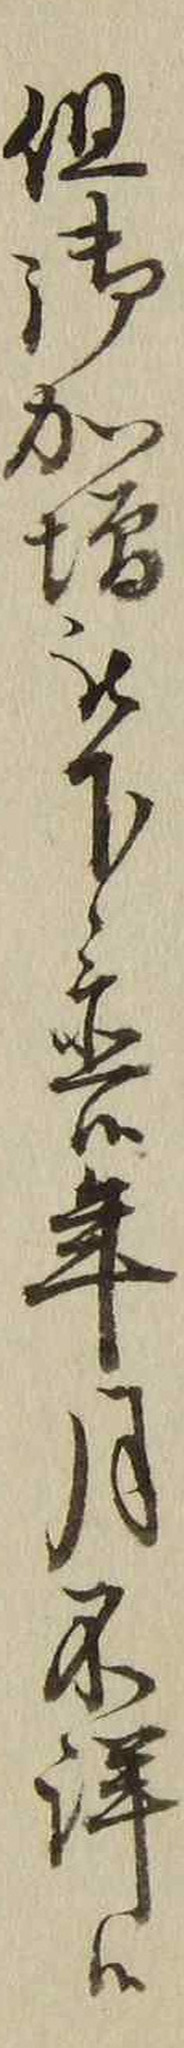但御加増被下置候年月不詳候

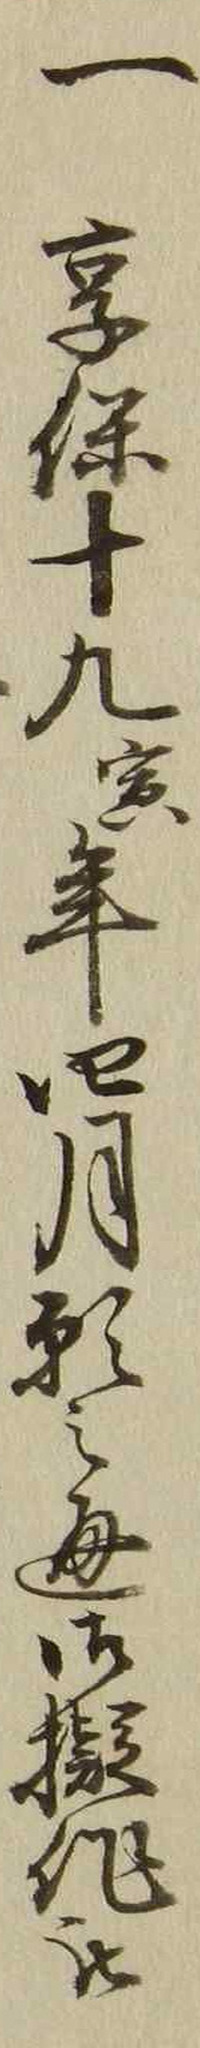一享保十九寅年四月願之通擬作被
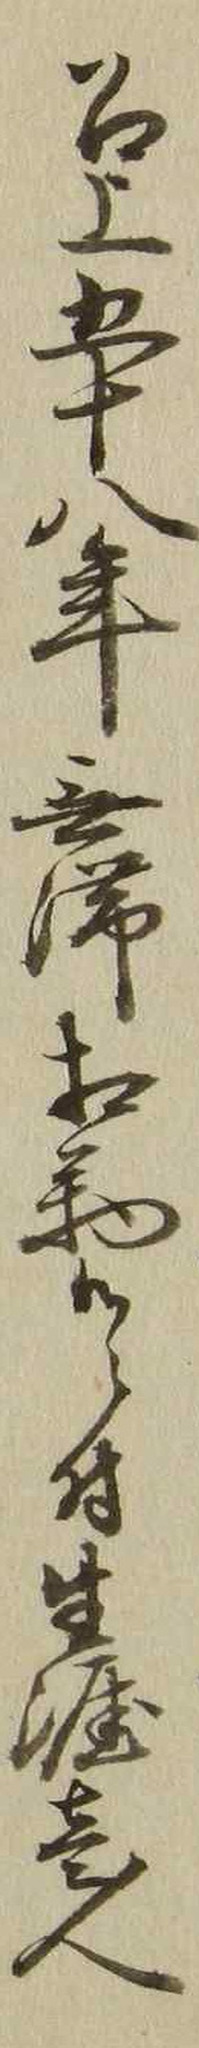召上五十八年無滞相勤候ニ付生涯壱人
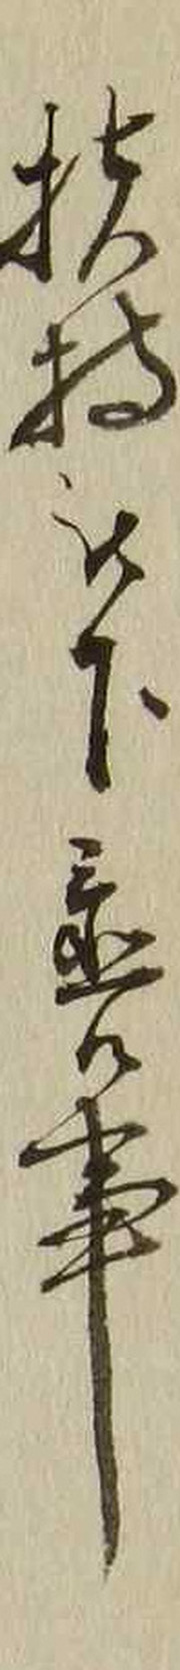扶持被下置候事
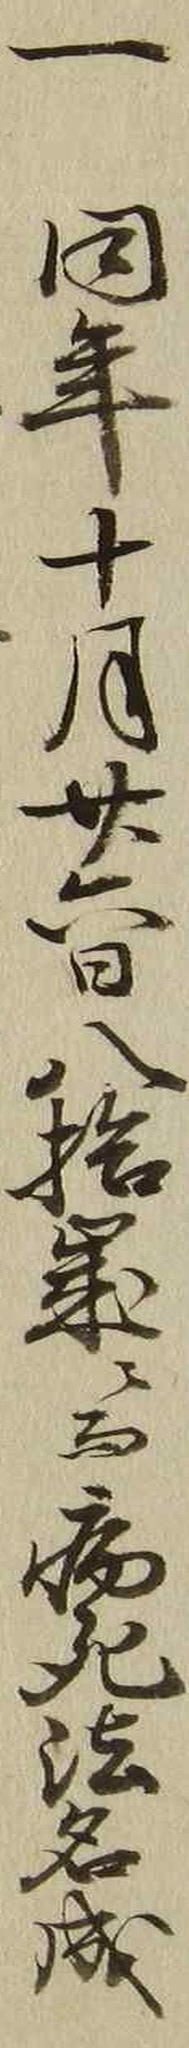一同年十月廿六日八拾歳ニ而病死法名成
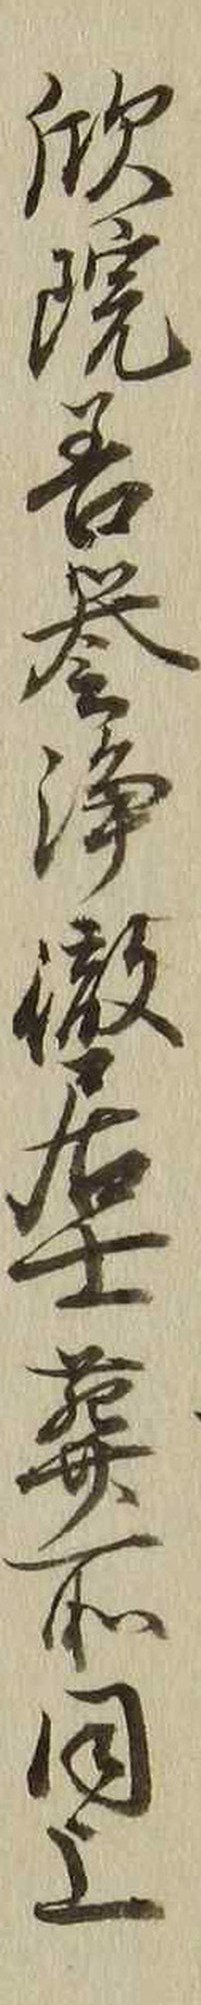欣院善誉淨徹居士葬所同上
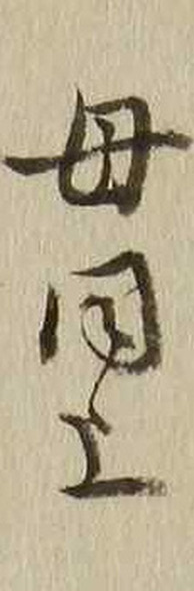母同上
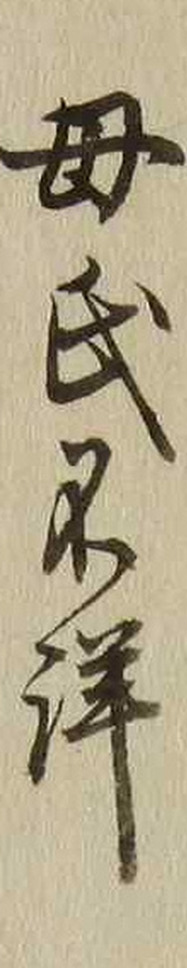母氏不詳
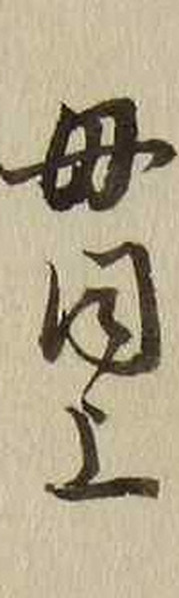母同上
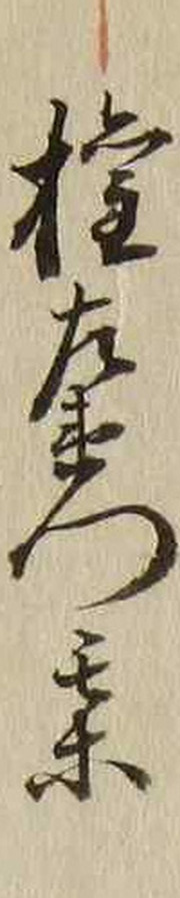権左衛門某
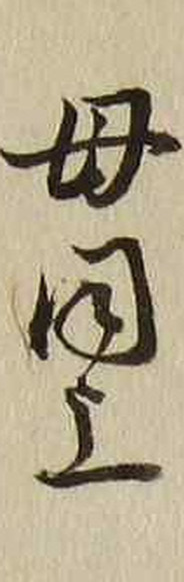母同上
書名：諸士系譜　巻之64　と之部7
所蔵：会津若松市立会津図書館
